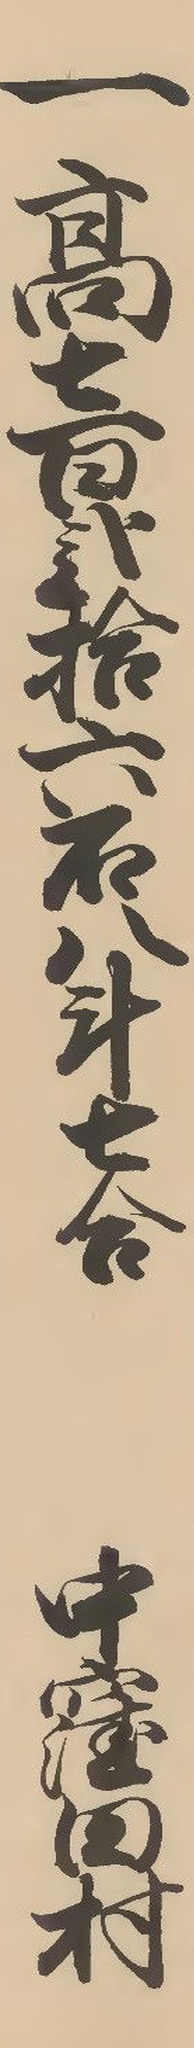一髙七百弐拾六石八斗七合中窪田村
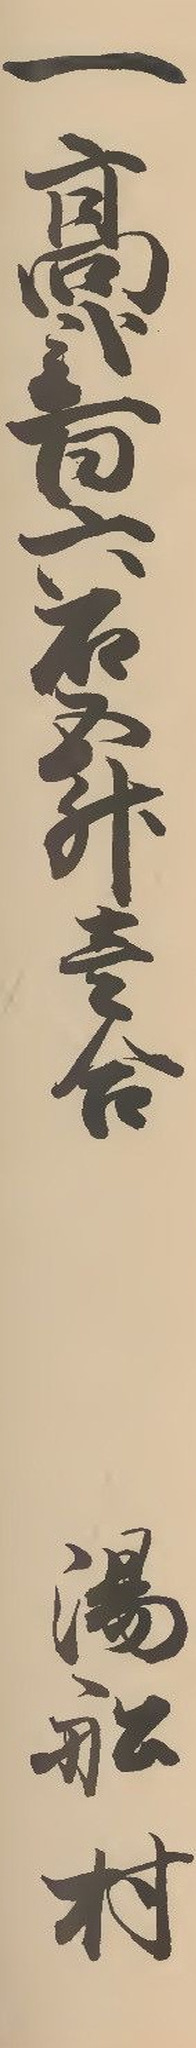一髙弐百六石五斗壱合湯舩村
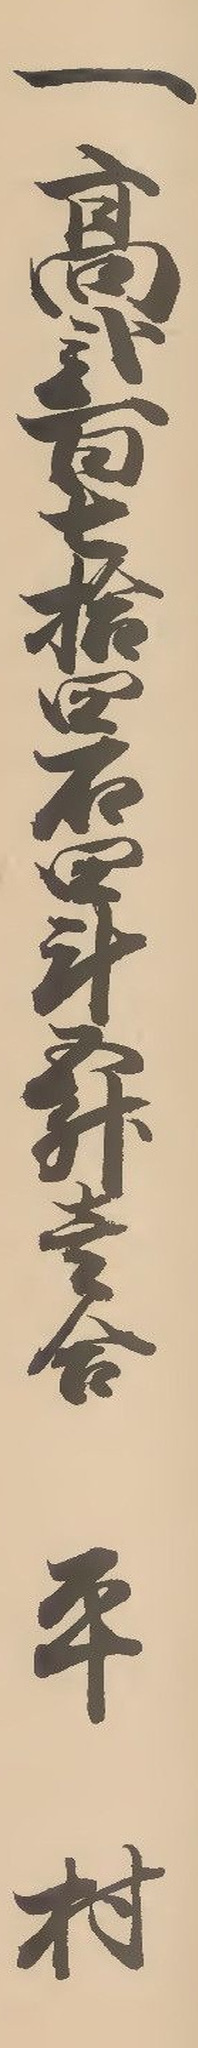一髙弐百七拾四石四斗五升壱合平村
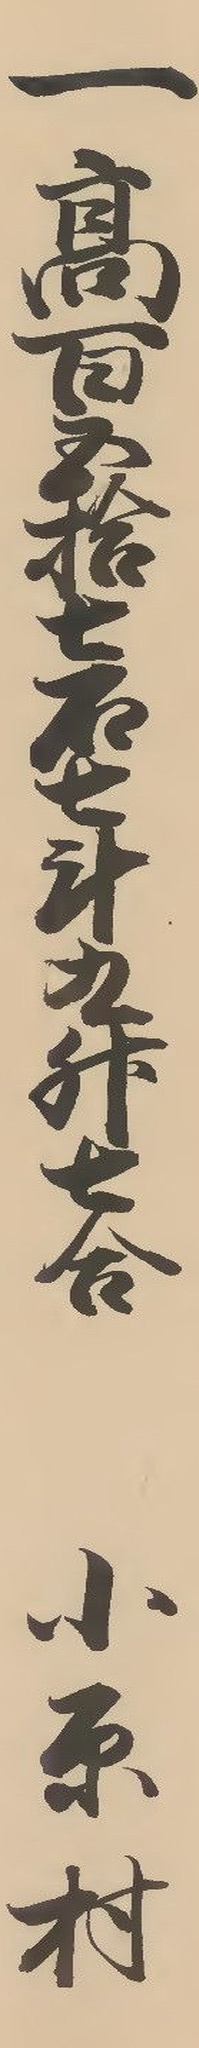一髙百五拾七石七斗九升七合小原村
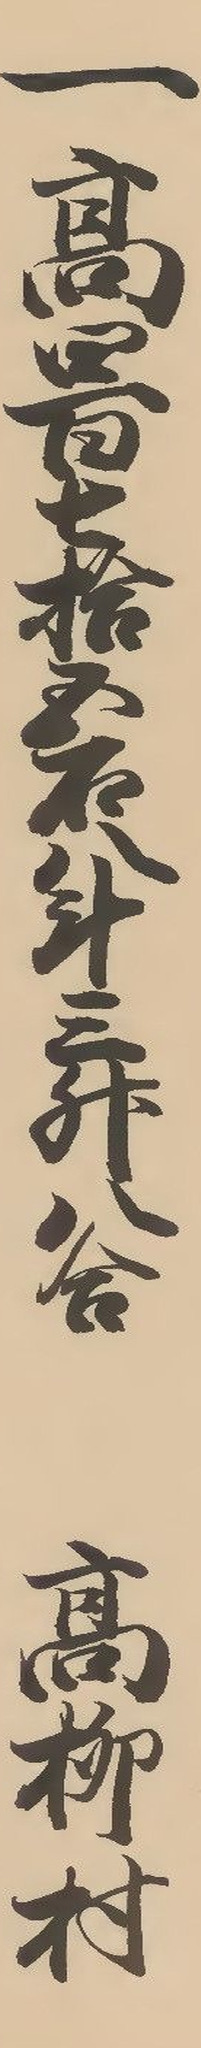一髙四百七拾五石八斗三升八合高柳村
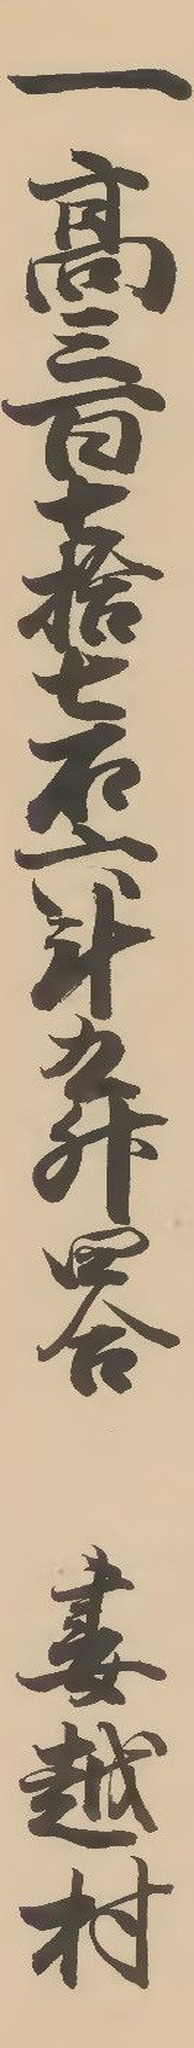一髙三百七拾七石六斗九升四合妻越村

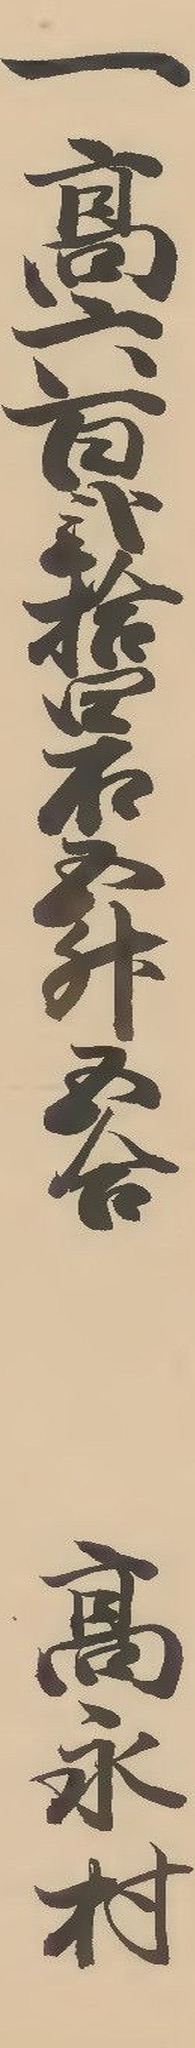一髙六百弐拾四石五升五合髙永村
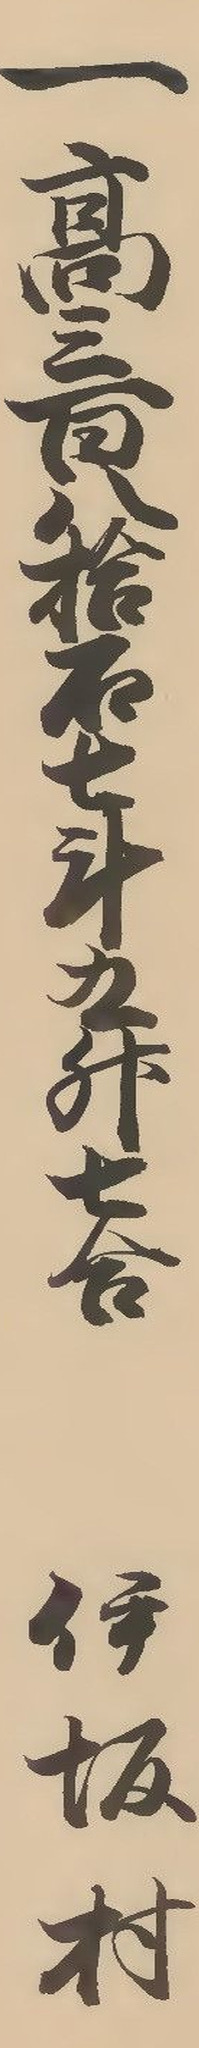一髙三百八拾石七斗九升七合伊坂村
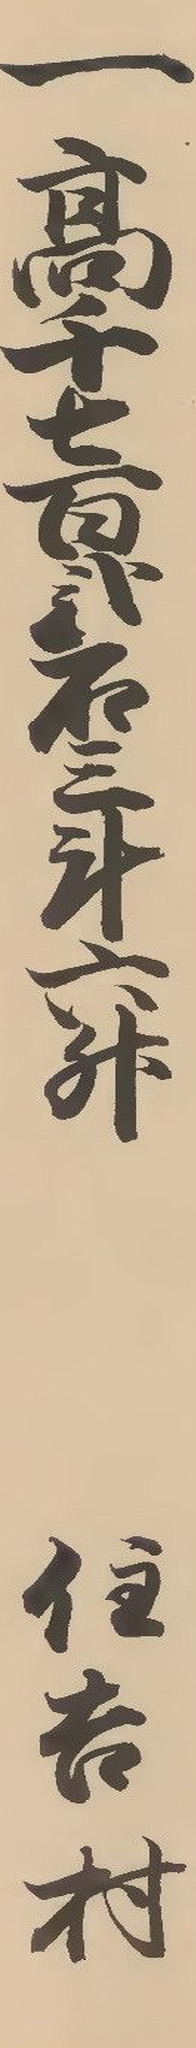一髙千七百弐石三斗六升住吉村
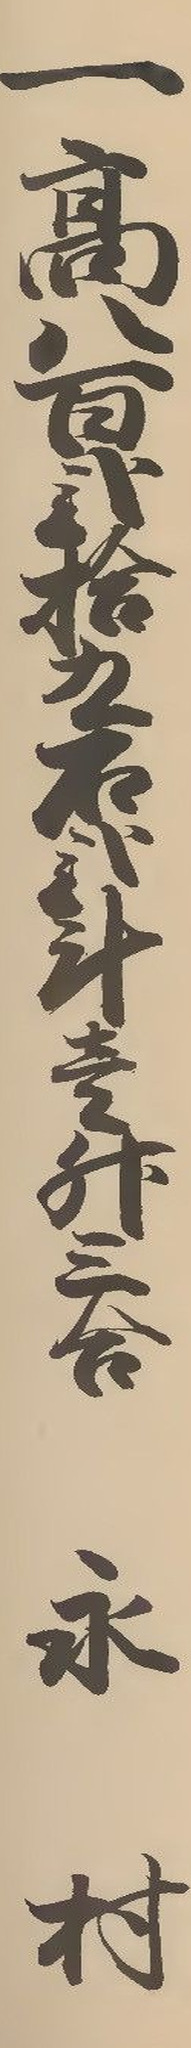一髙八百弐拾九石弐斗壱升三合永村
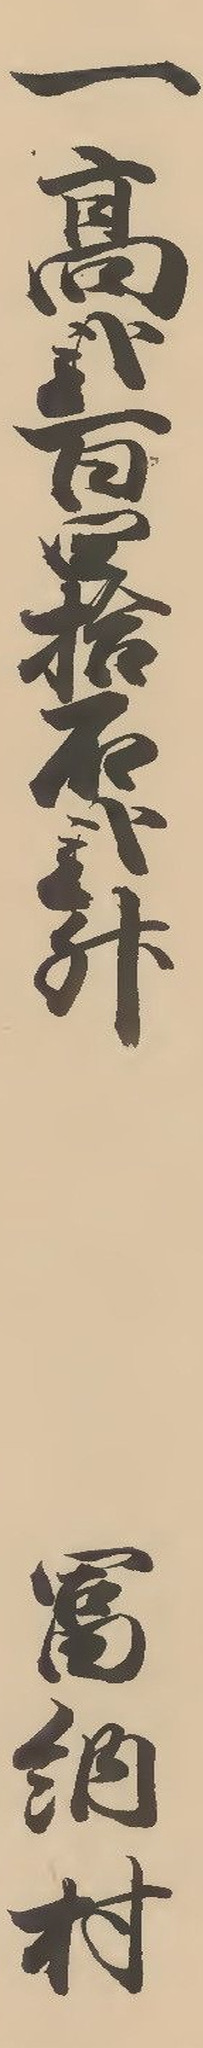一髙弐百四拾石弐升冨能村
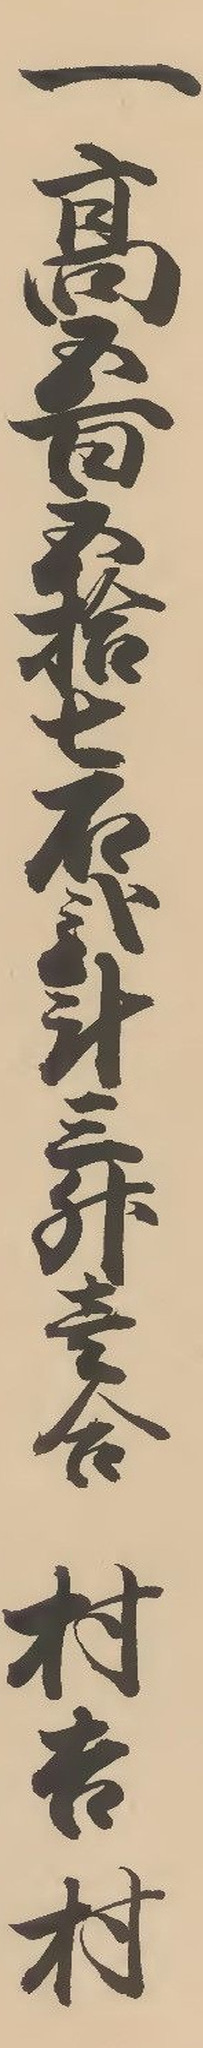一髙五百五拾七石弐斗三升壱合村吉村
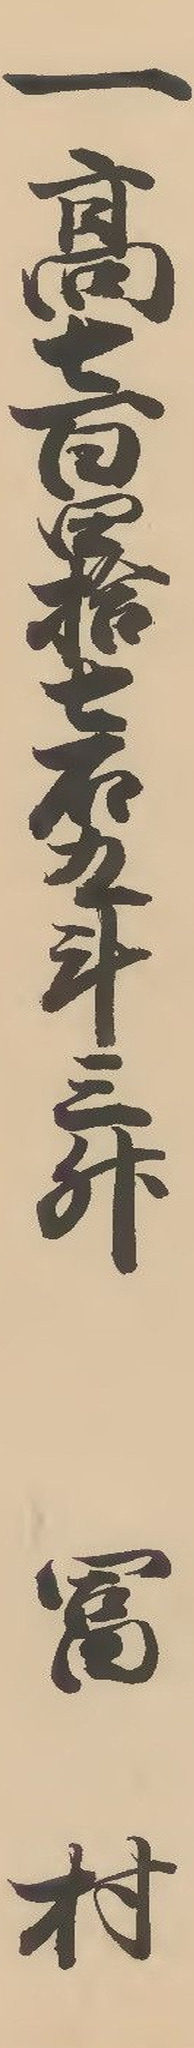一髙七百四拾七石九斗三升冨村

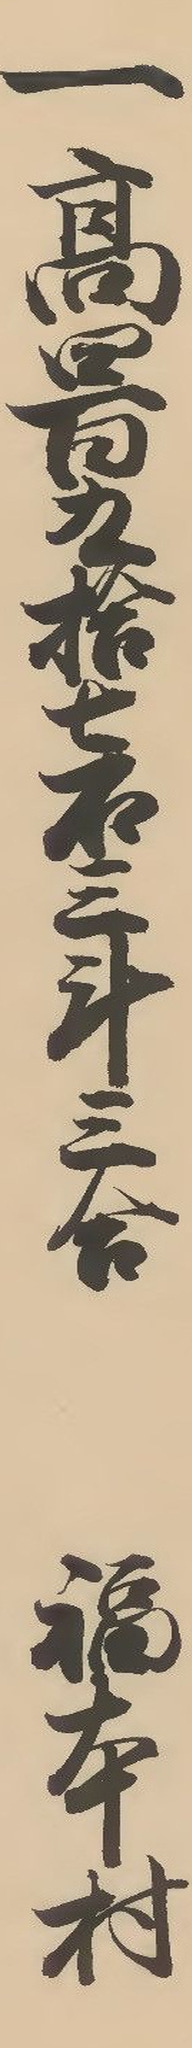一髙四百九拾七石三斗三合福本村
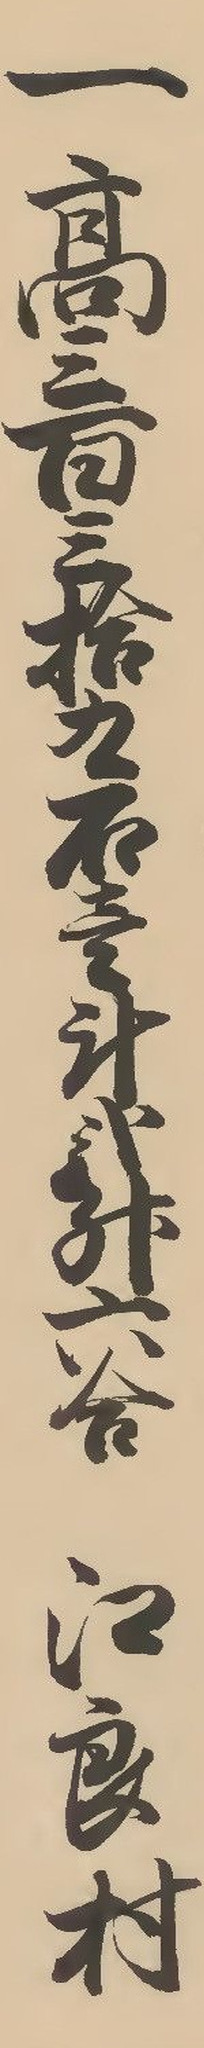一髙三百三拾九石壱斗弐升六合江良村
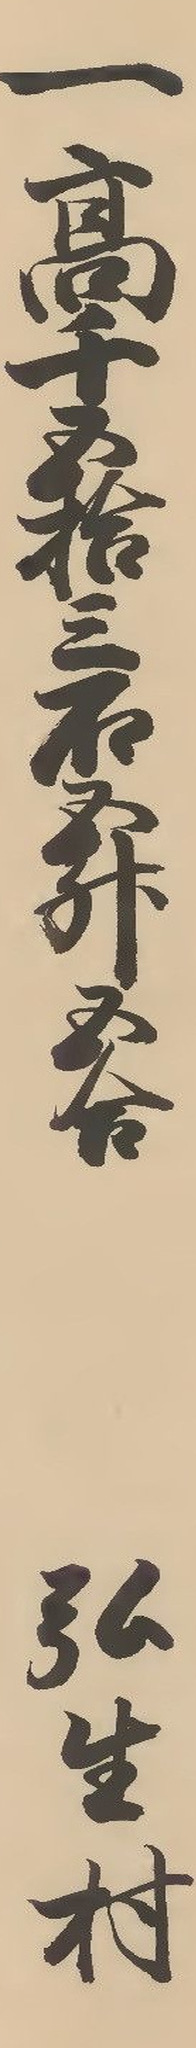一髙千五拾三石五升五合弘生村
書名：肥後国郷帳
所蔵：国立公文書館 National Archives of Japan
